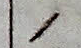1
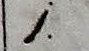1.
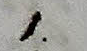1.
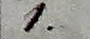1.
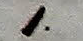1.
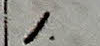1.
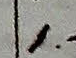1
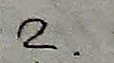2.
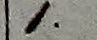1.
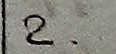2.
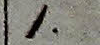1.
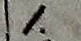1.
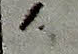1.
